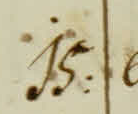15:
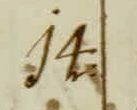14:
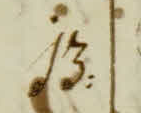13:
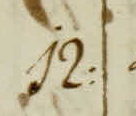12:
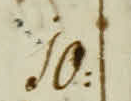10:
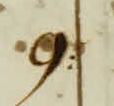9:
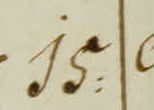15:
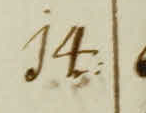14:
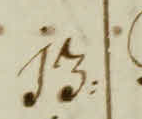13:
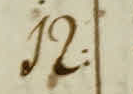12:
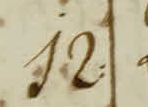12:
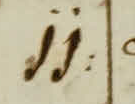11:
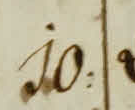10:
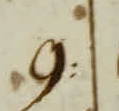9:
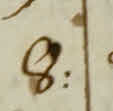8:
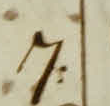7:
